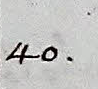40.
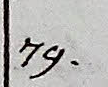79.
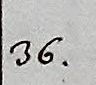36.
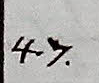47.
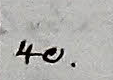40.
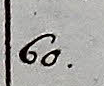60.
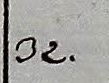32.
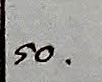50.
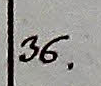36.
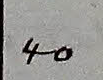40
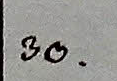30.
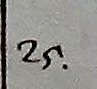25.
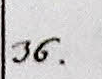36.
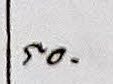50.
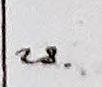28.
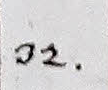32.
